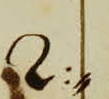2:
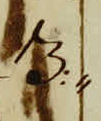3:
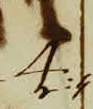4:
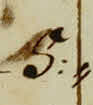5:
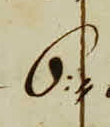6:
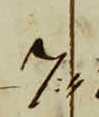7:
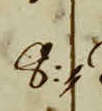8:
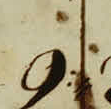9:
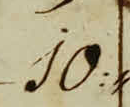10:
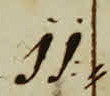11:
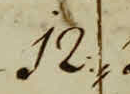12:
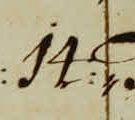14:
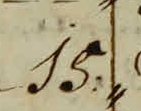15:
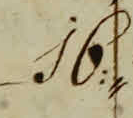16:
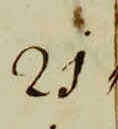21
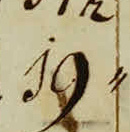19
